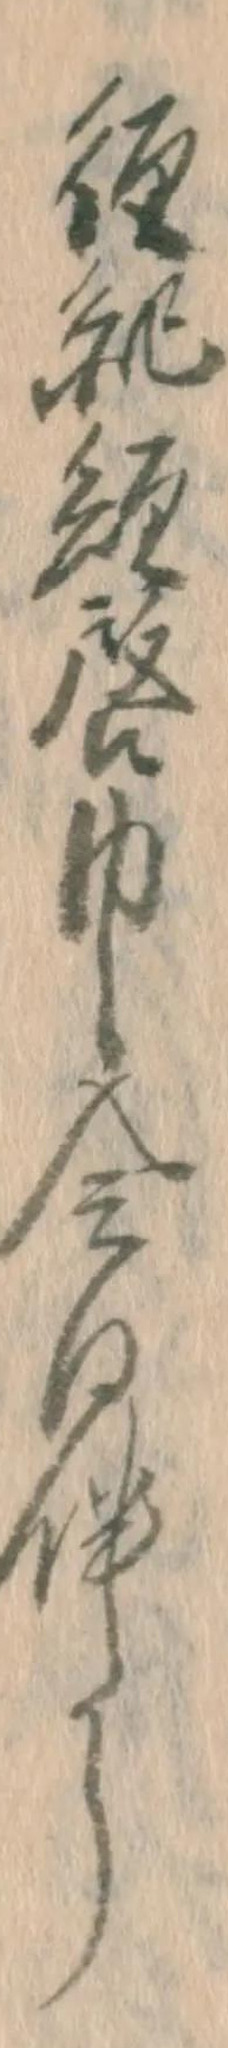経紀経啓内々令日伴了
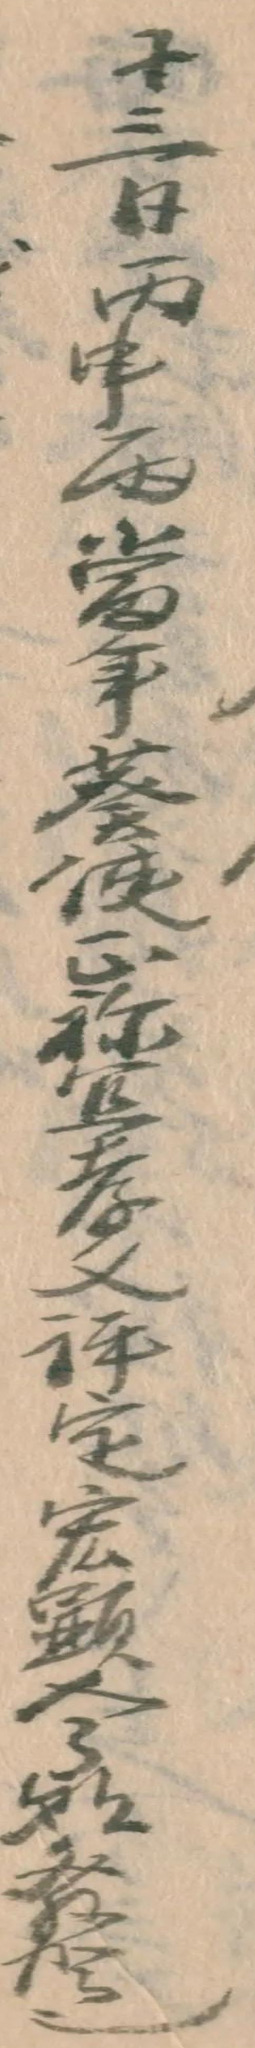十三日丙申雨當年葵使正称宜孝久評定宏顕今朝発駕也
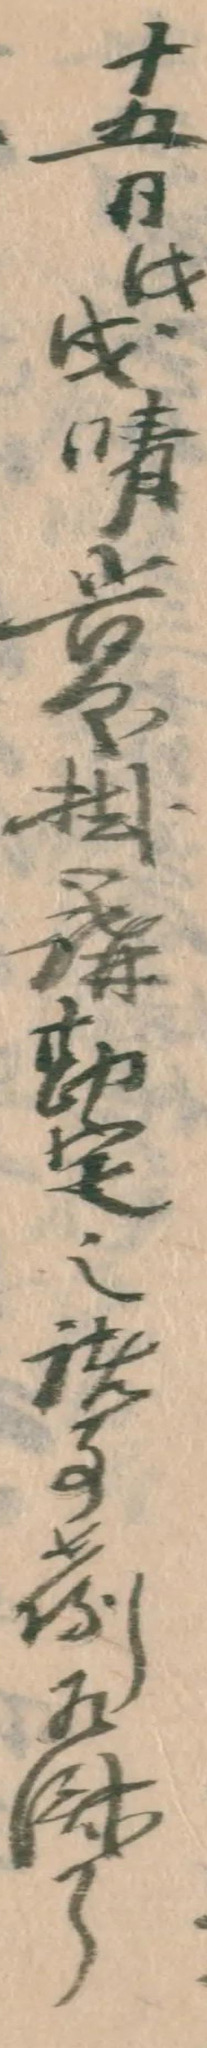十五日戊戌晴弐百匁御講勘定之諸事如例相済了
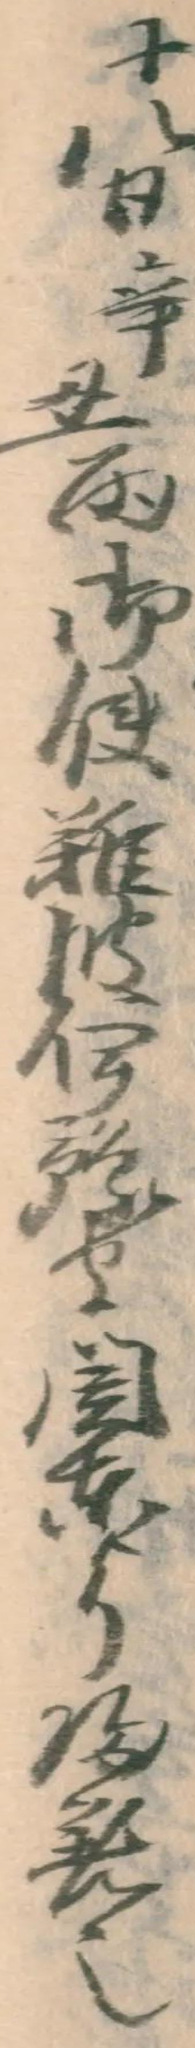十八日辛丑雨御使難波伊豫守関東より帰着也
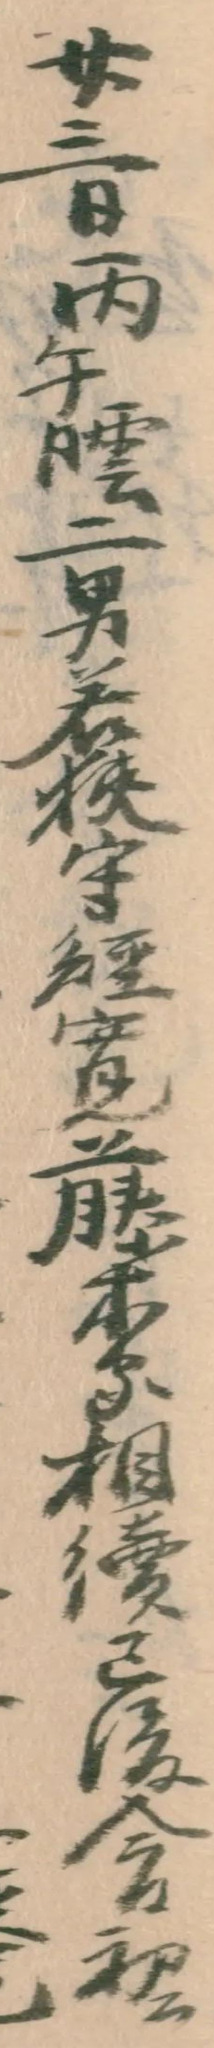廿三日丙午曇二男若狭守経寛藤木家相續已後今日初而
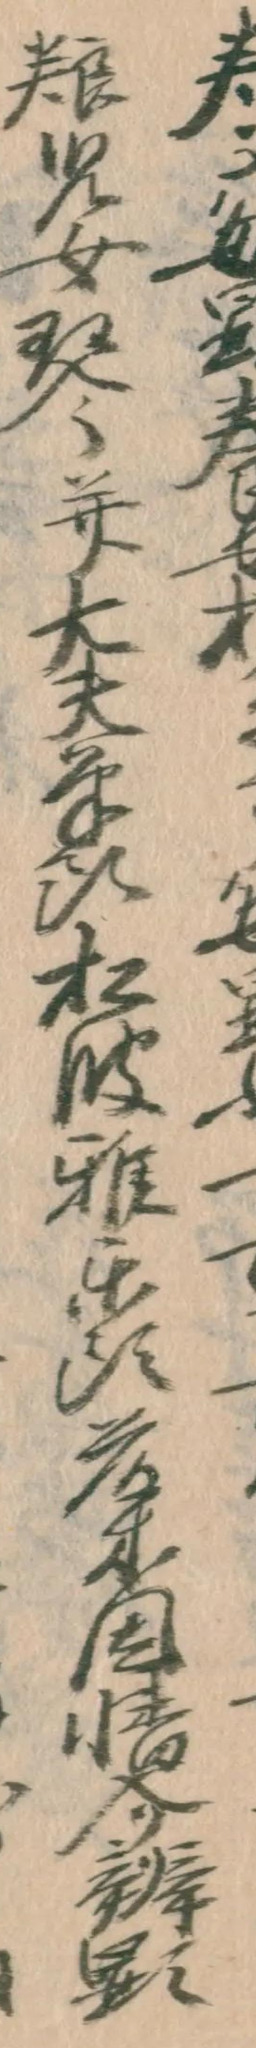養児女琴幷大夫年頭松波雅楽頭藤木因幡介辨顕
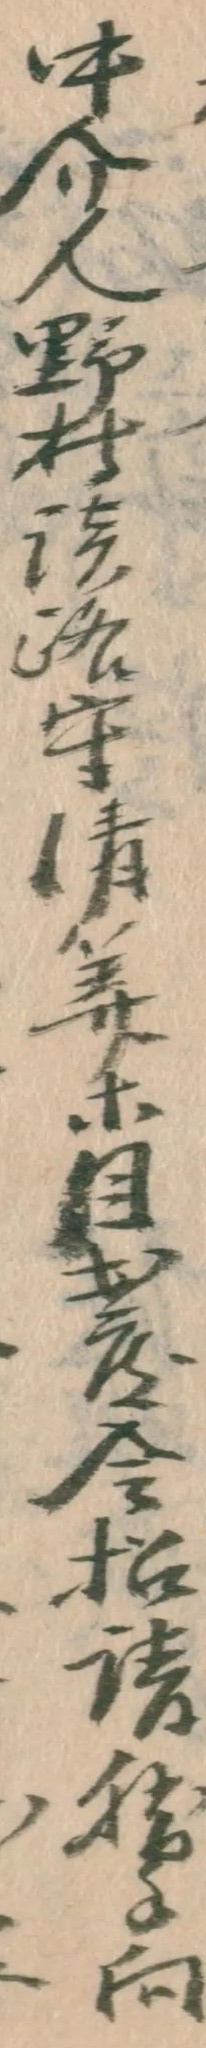中介人野村淡路守清算等目出度令招請勝手向
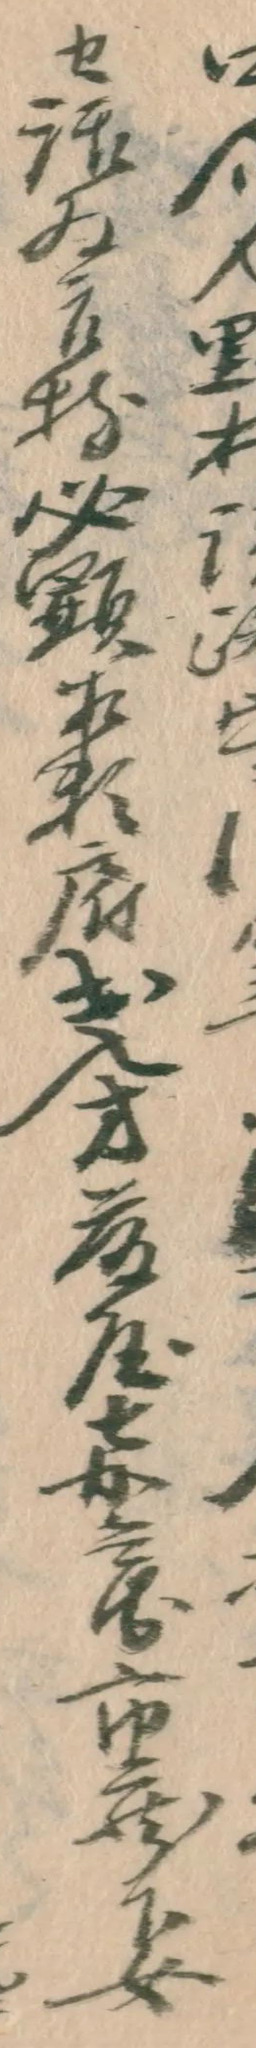セ詰為所持必顕相頼肩出入方藤屋七加兵衛市蔵下女
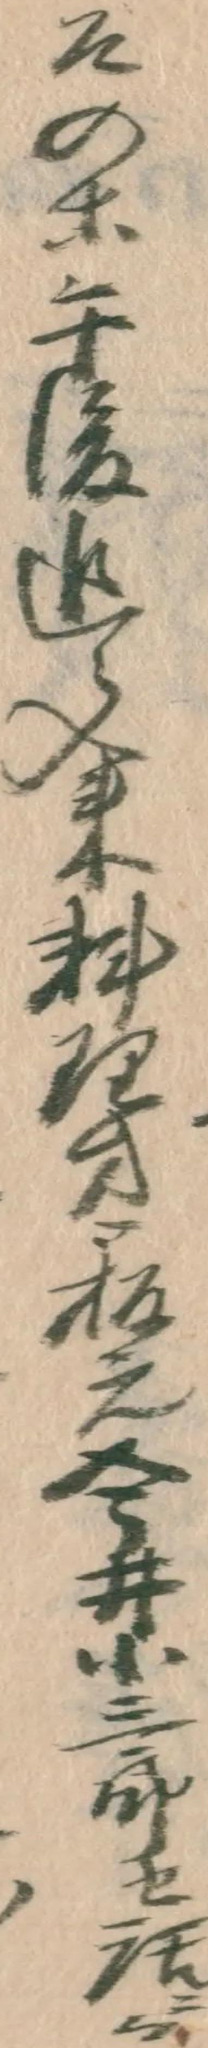そのホ午後追々入来料理方御板元今井小三郎世話ニ而
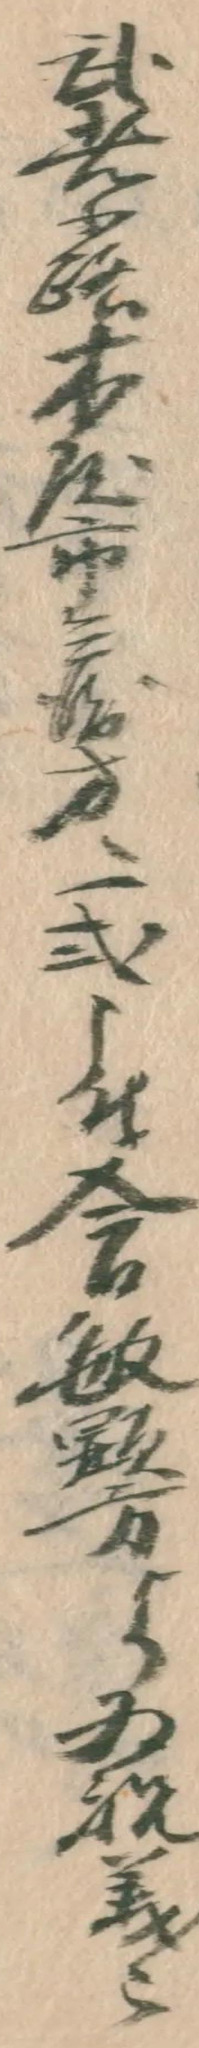武者小路木屋市兵衛方へ一式申付今日敏顕方より為祝義被
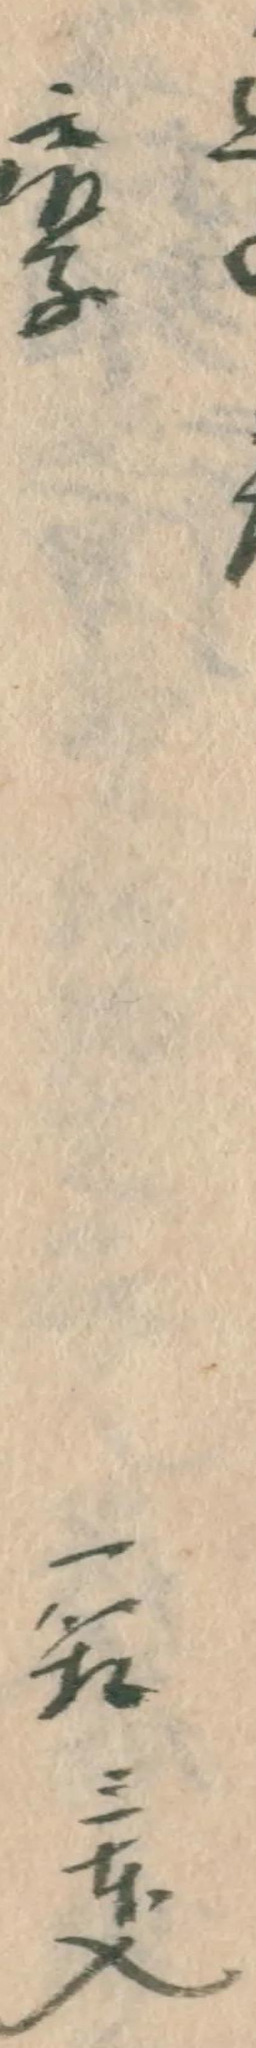扇子一箱三本入
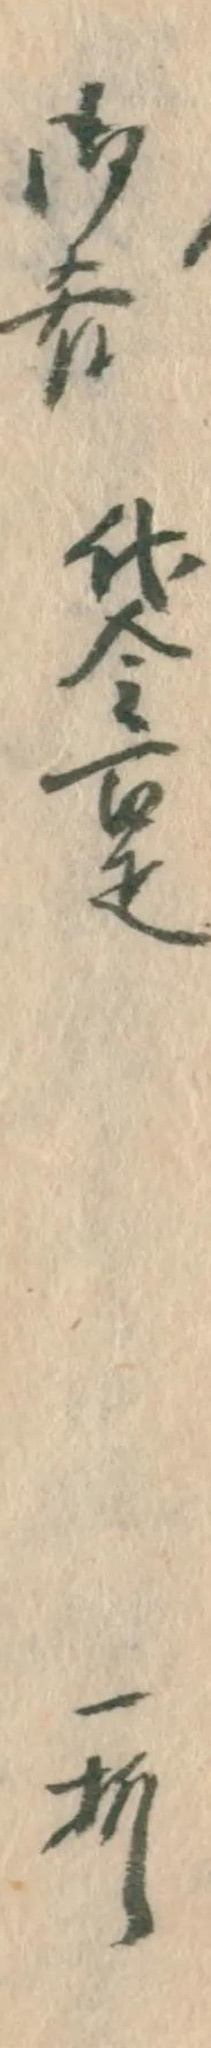御肴代金百疋一折
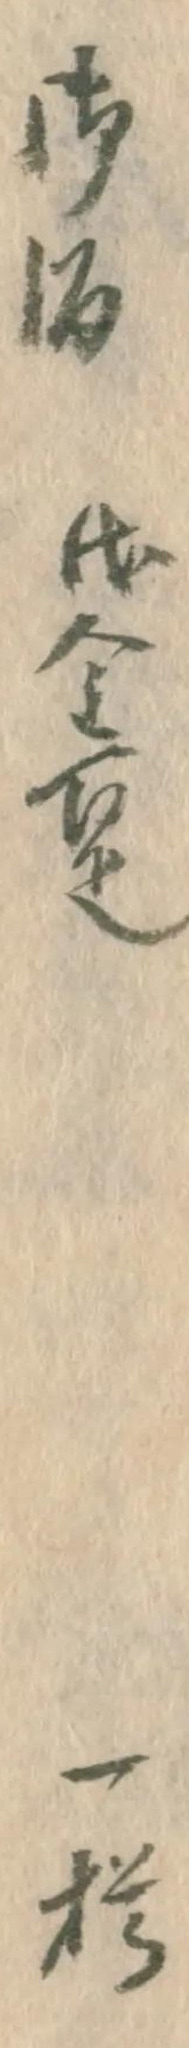御酒代金百疋一樽
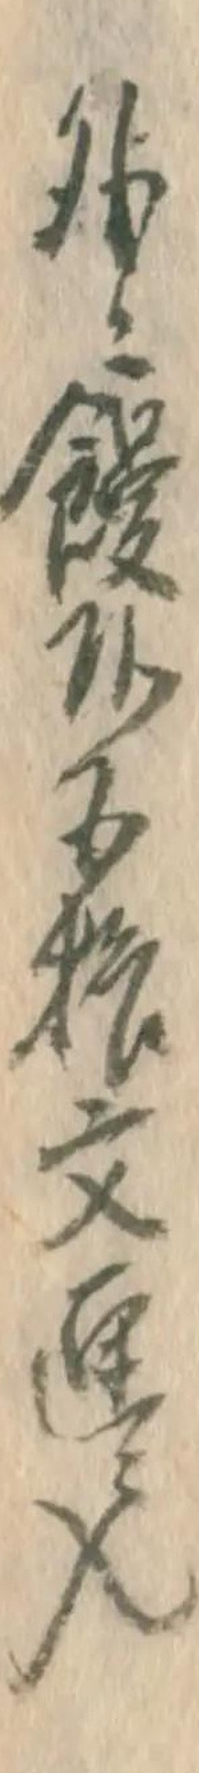外ニ饅頭五拾文匣ニ入

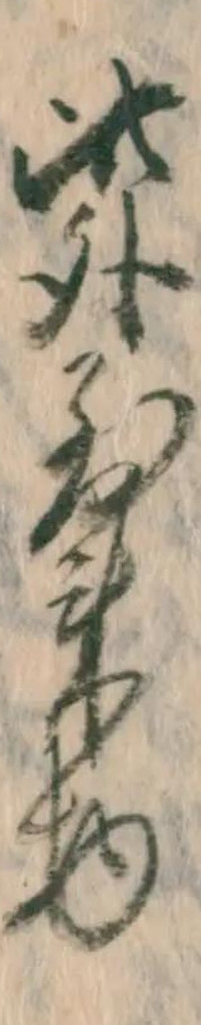此外到来物
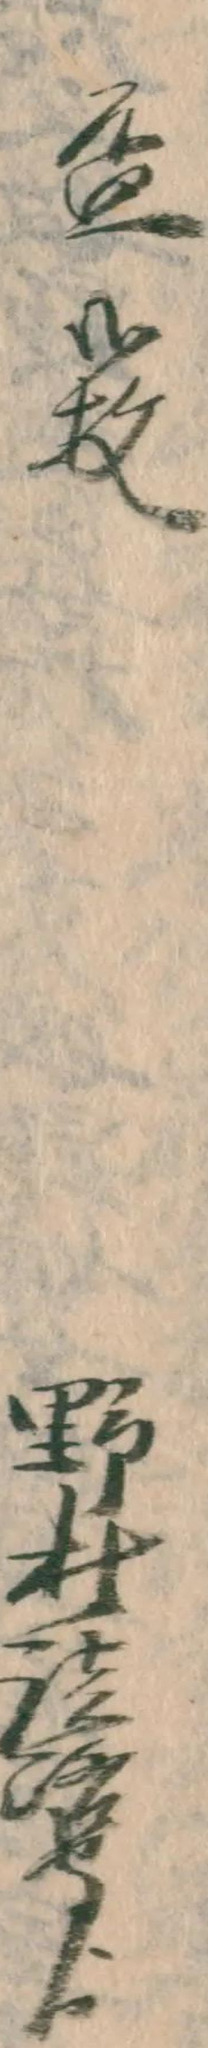盃弐枚野村談路守ゟ
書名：賀茂社記録. 第67冊
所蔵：国立国会図書館 National Diet Library, JAPAN
